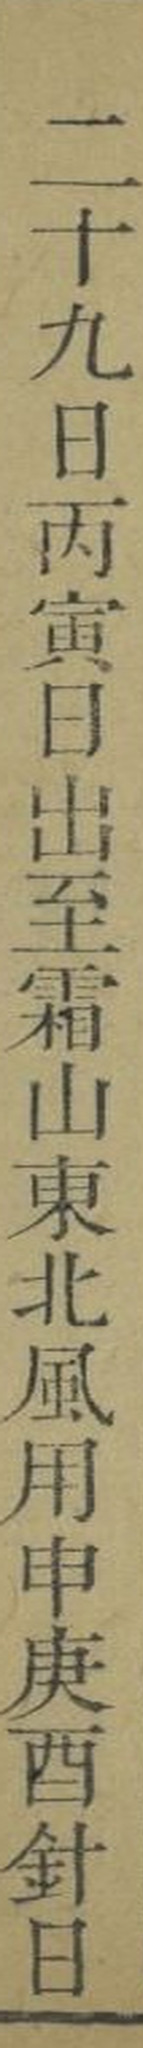二十九日丙寅日出至霜山東北風用申庚酉針日
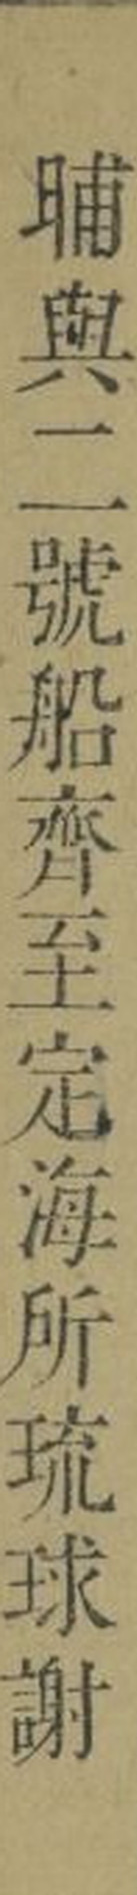晡與二號船齊至定海所琉球謝
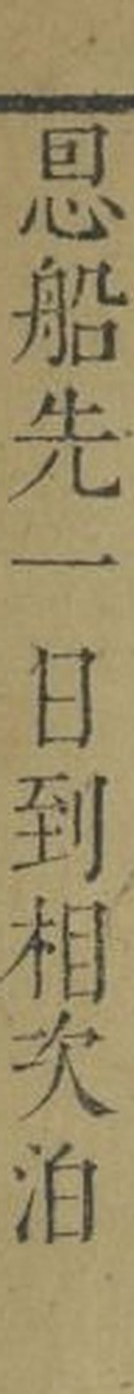㤙船先一日到相次泊

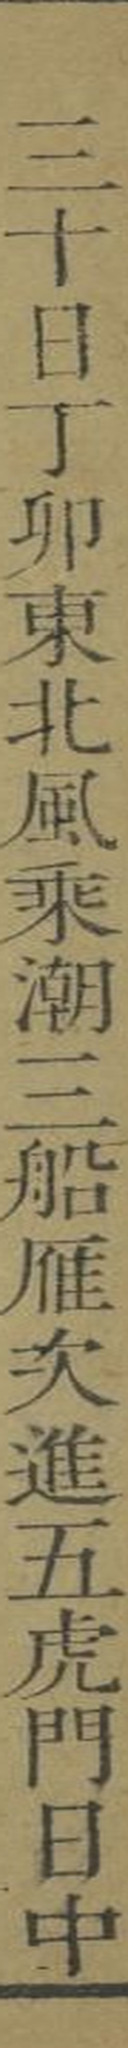三十日丁卯東北風乘潮三船雁次進五虎門日中
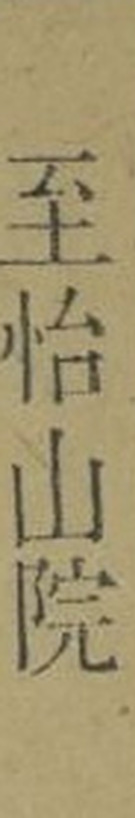至怡山院
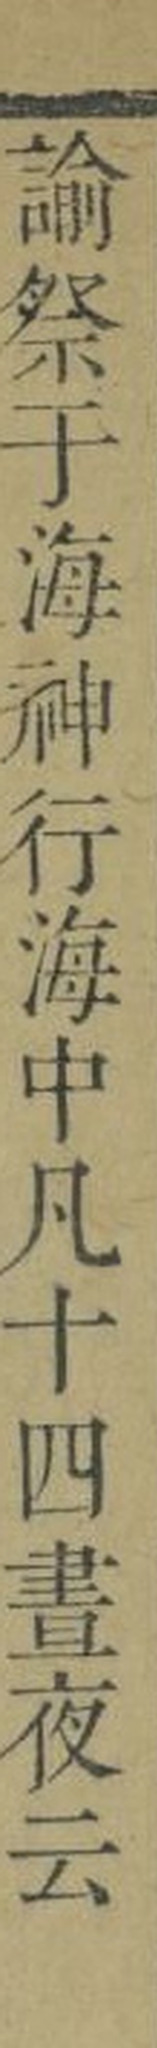諭祭于海神行海中凡十四晝夜云
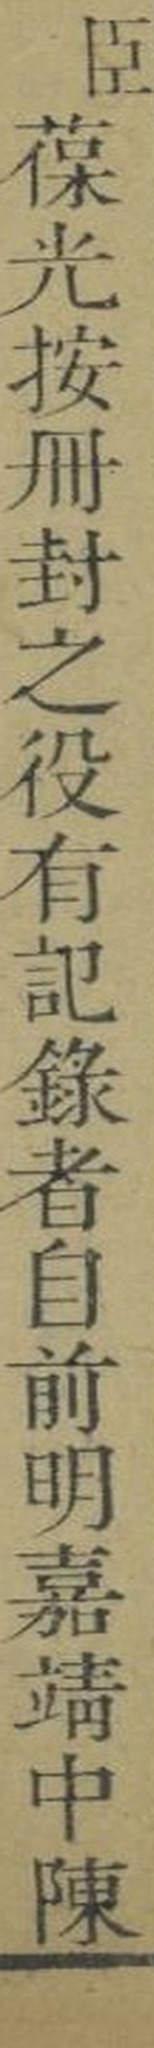臣葆光按冊封之役有記錄者自前明嘉靖中陳
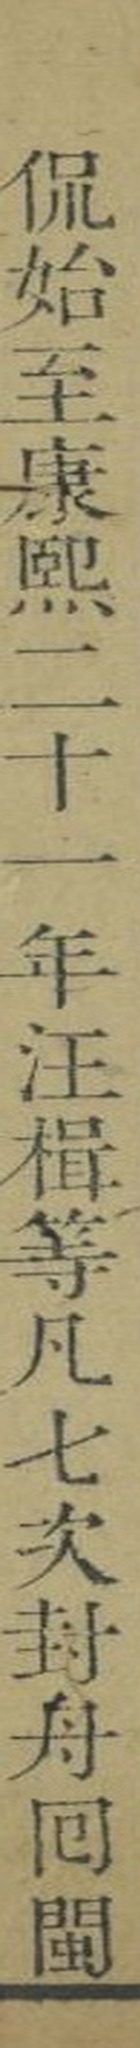侃始至康熙二十一年汪楫等凡七次封舟囘閩
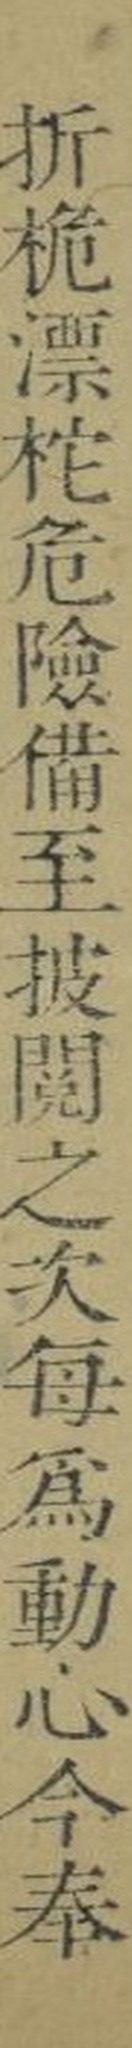折桅漂柁危險備至披閲之次每爲動心今奉
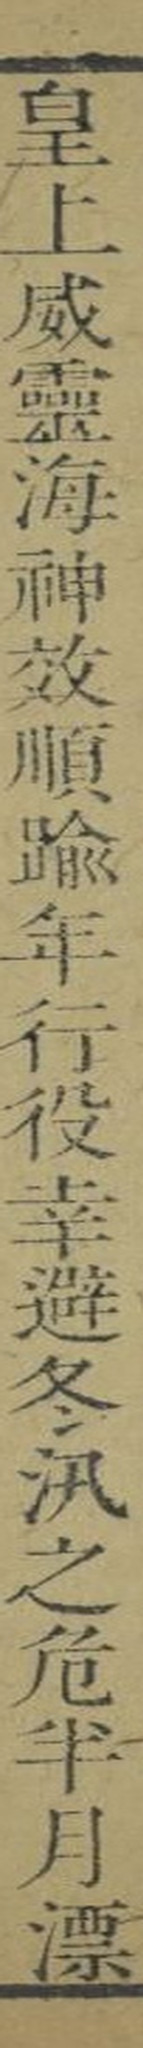皇上威靈海神效順踰年行役幸避冬汛之危半月漂
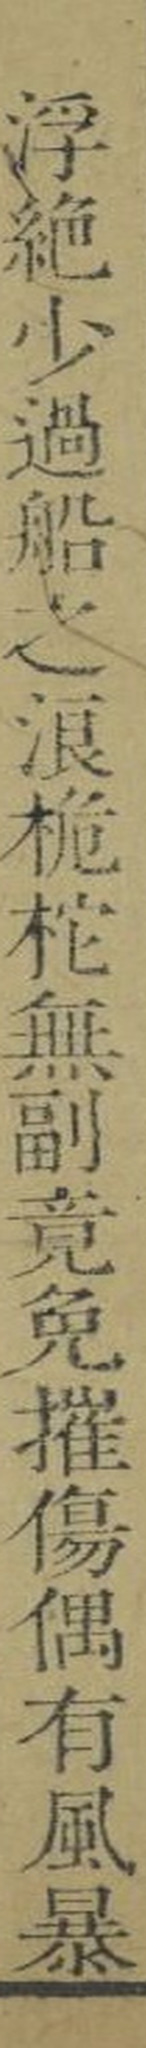浮絶少過船之浪桅柁無副竟免摧傷偶有風暴
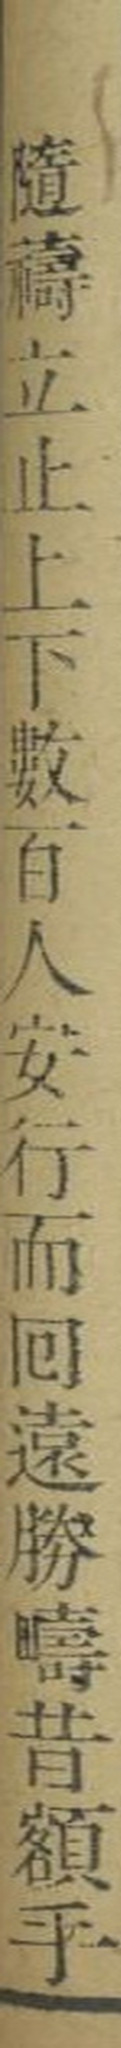隨禱立止上下數百人安行而囘遠勝疇昔額手
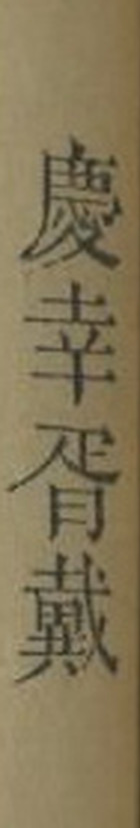慶幸胥戴
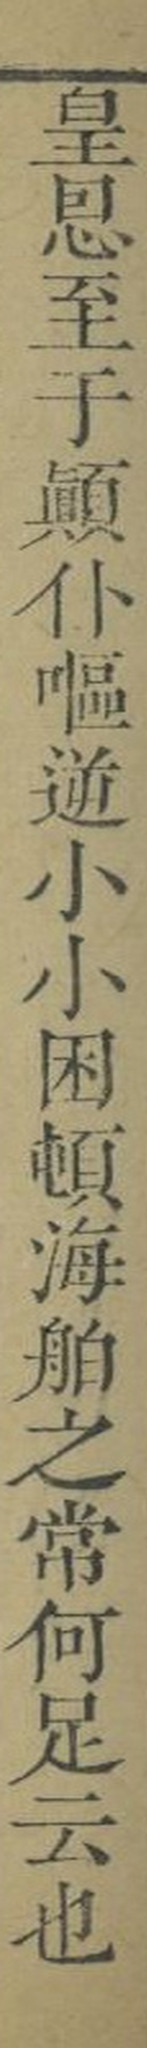皇㤙至于顚仆嘔逆小小困頓海舶之常何足云也
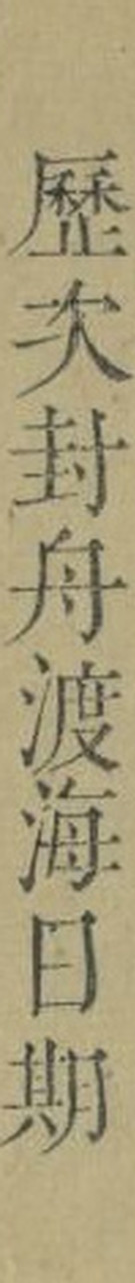歷次封舟渡海日期
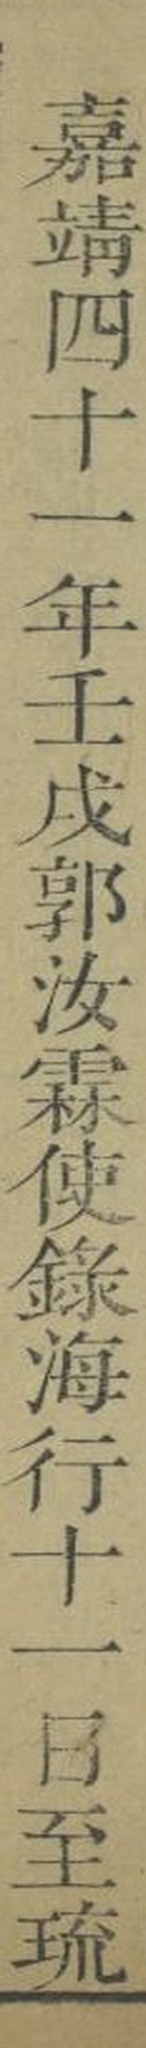嘉靖四十一年壬戌郭汝霖使錄海行十一日至琉
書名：中山伝信録 巻一
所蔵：University of the Ryukyus Library
